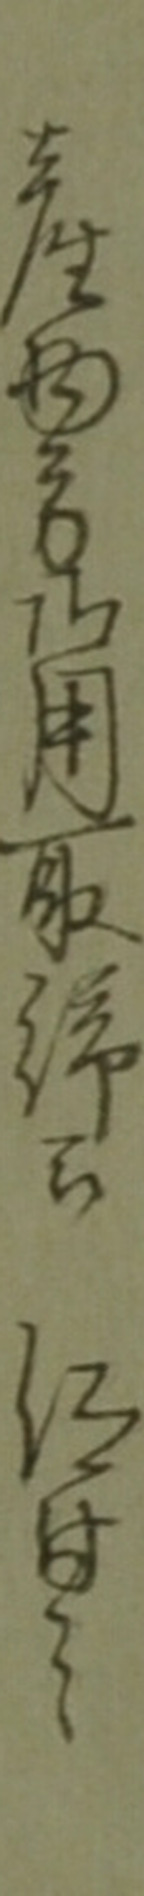産物方御用取締被仰付之
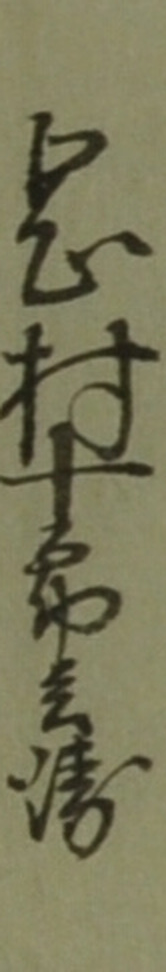岡村十郎兵衛
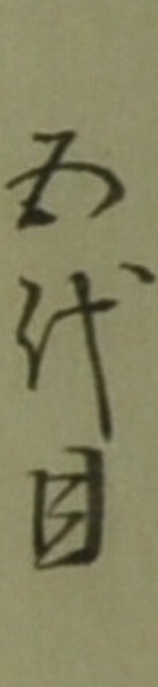五代目
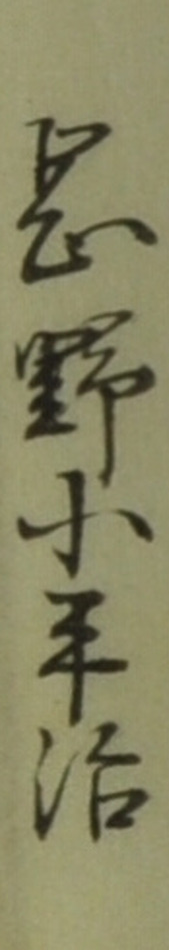岡野小平治

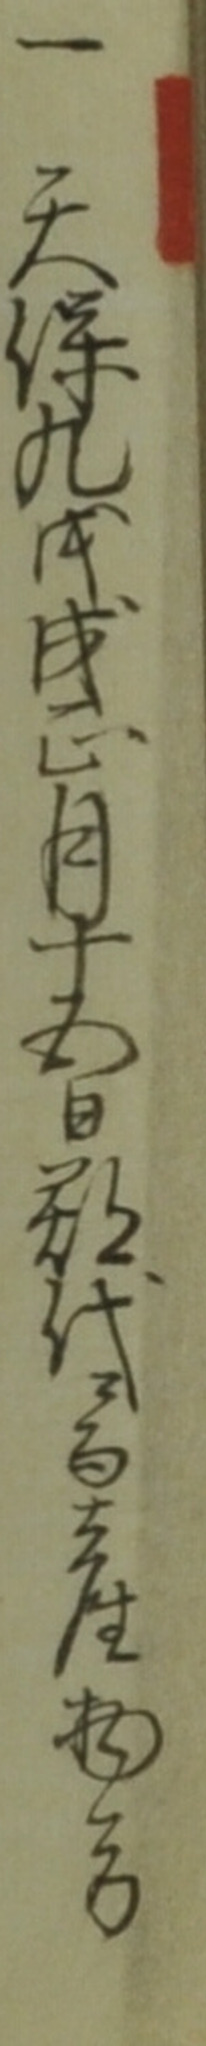一天保九戊戌正月十五日郡代ニ而産物方
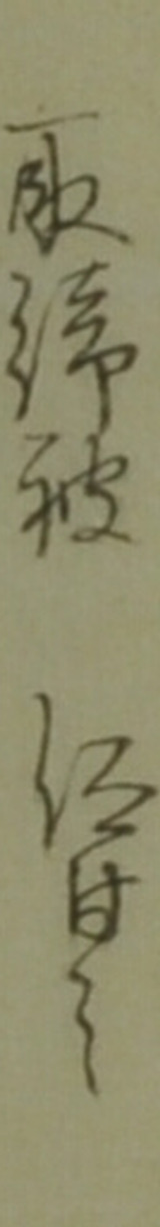取締被仰付之
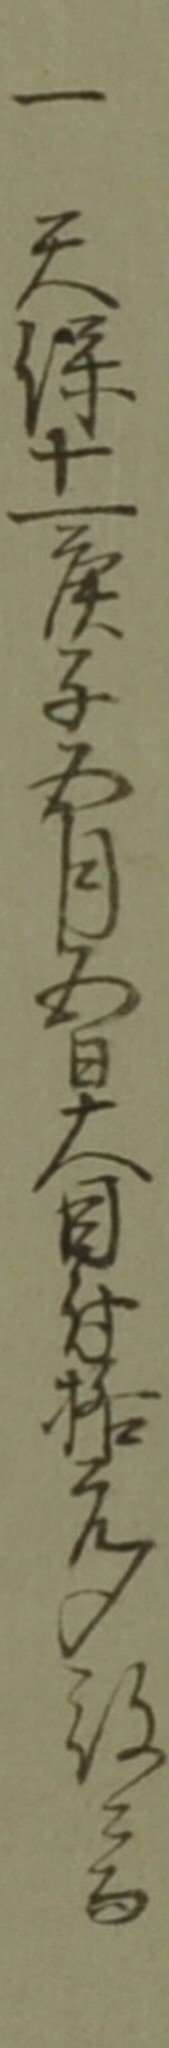一天保十一庚子五月五日大目付格元〆役ニ而
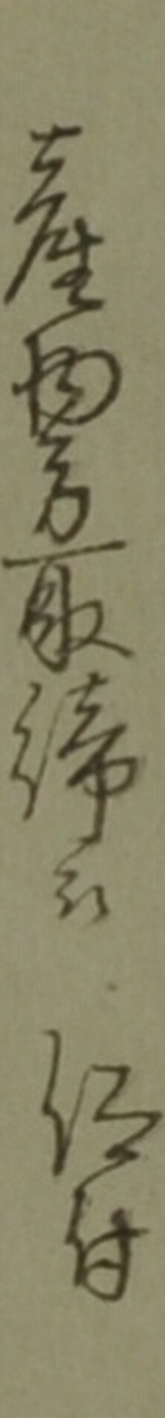産物方取締被仰付
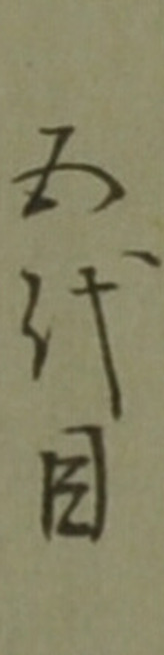五代目
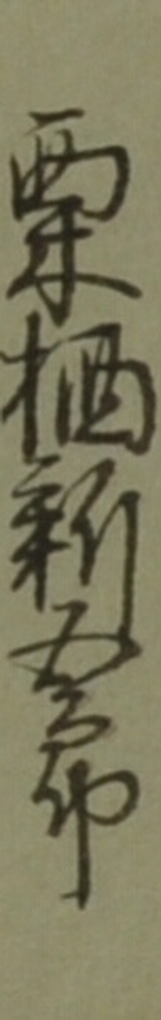栗栖新五郎
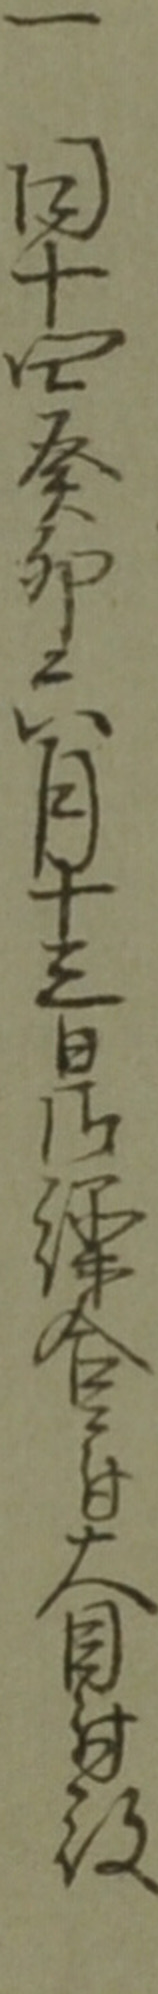一同十四癸卯六月十三日御繰合ニ付大目付役
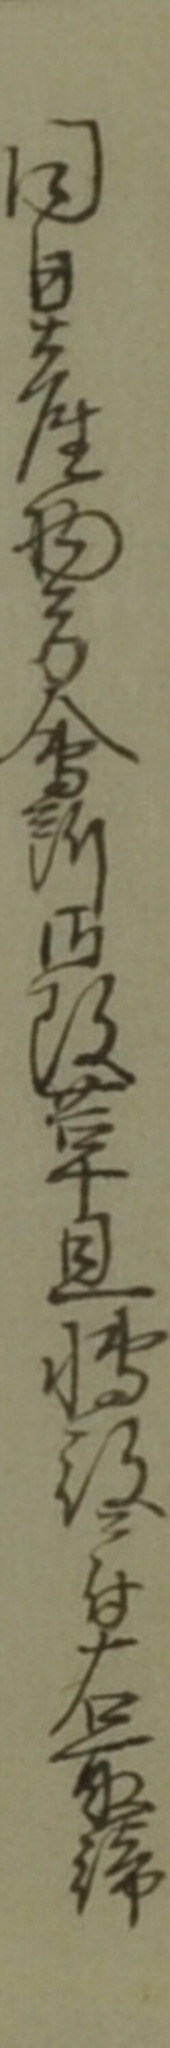一同日産物方会所御改革且転役ニ付右取締
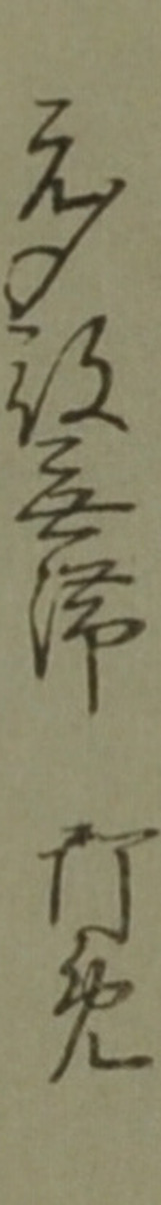元〆役無滞御免
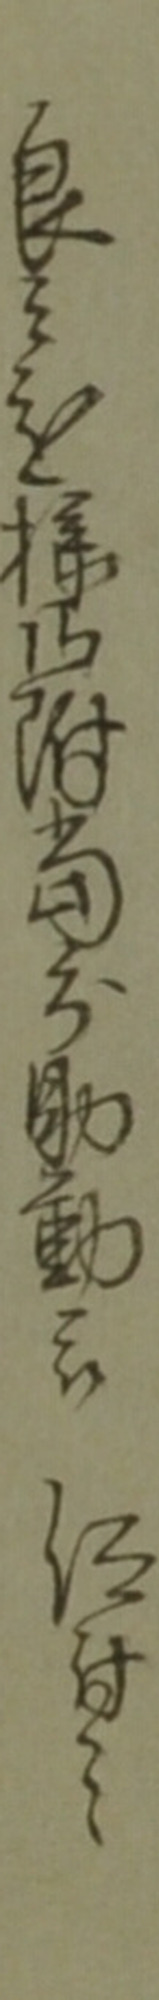良之進様御附当分助勤被仰付之
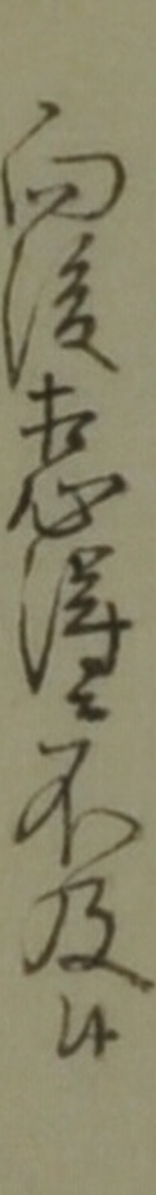向後相心得ニ不及候
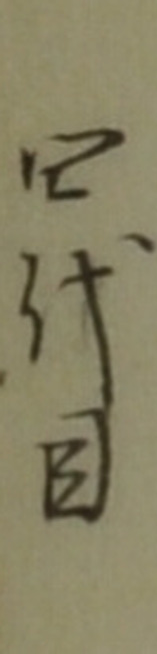四代目
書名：諸御役代々録（三）
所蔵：伊那市立高遠町図書館・合同会社AMANE
